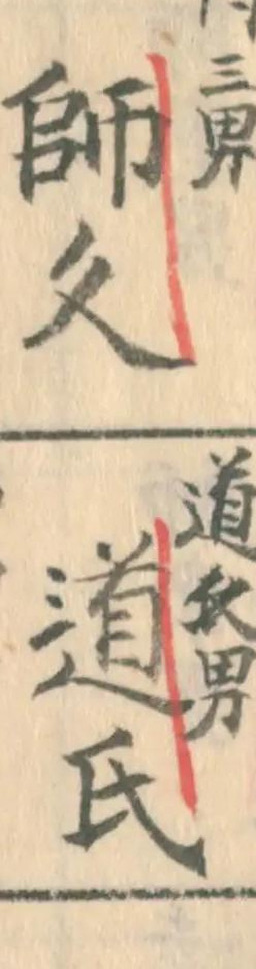師久道氏
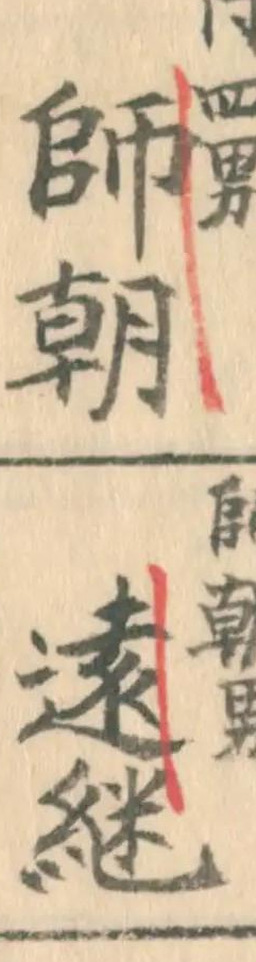師朝遠継
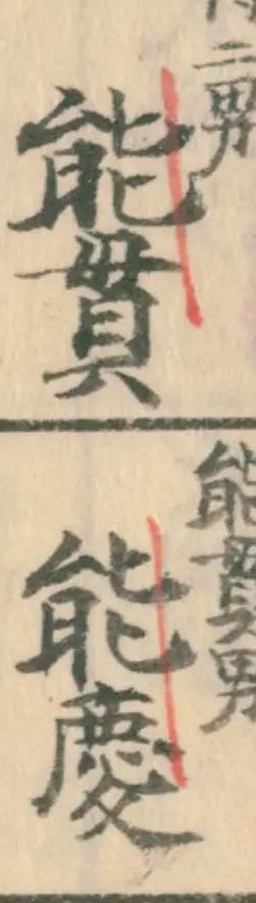能貫能慶
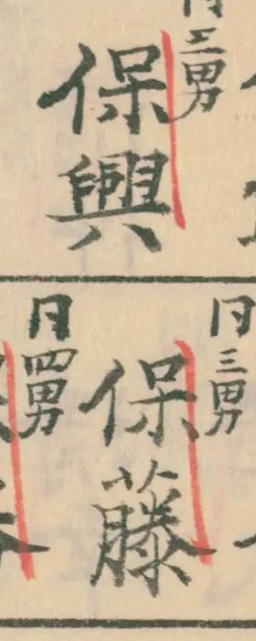保興保藤

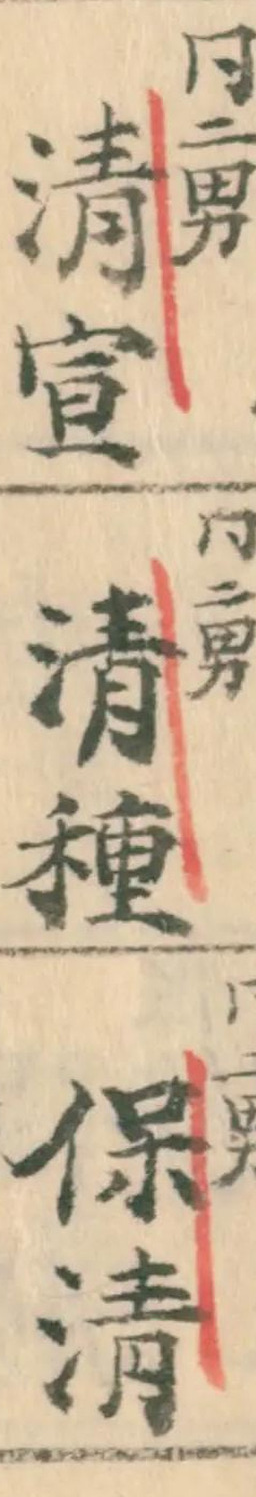清宣清種保清
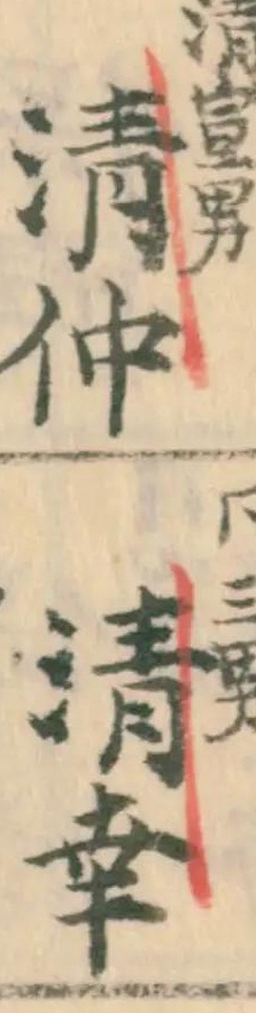清仲清幸
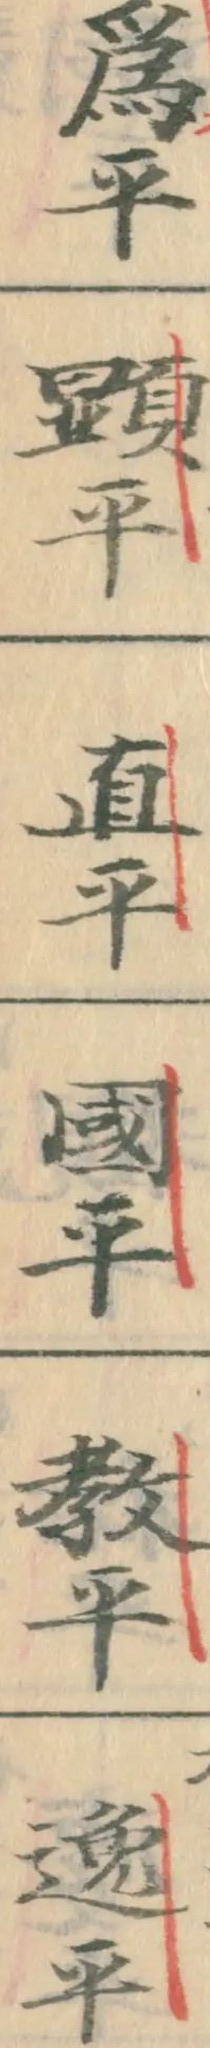為平顕平直平国平教平逸平

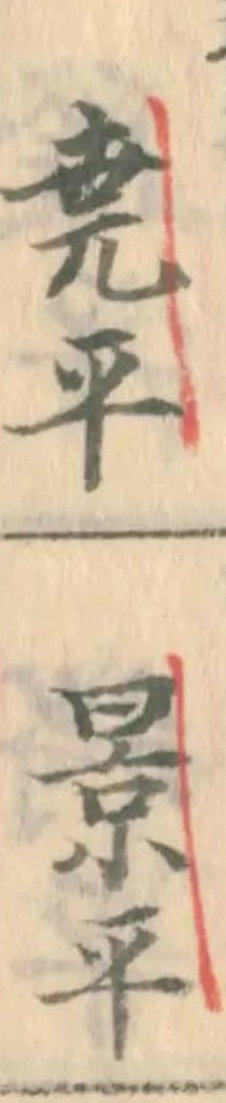尭平景平
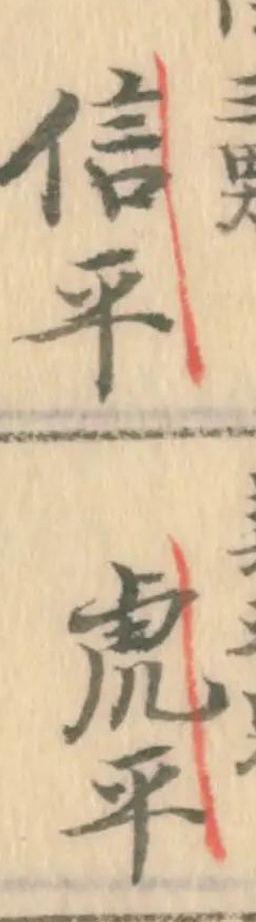信平虎平
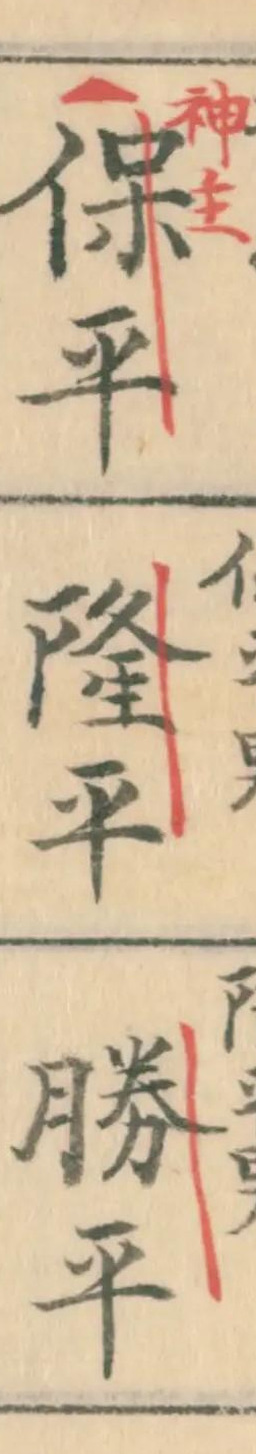▲保平隆平勝平

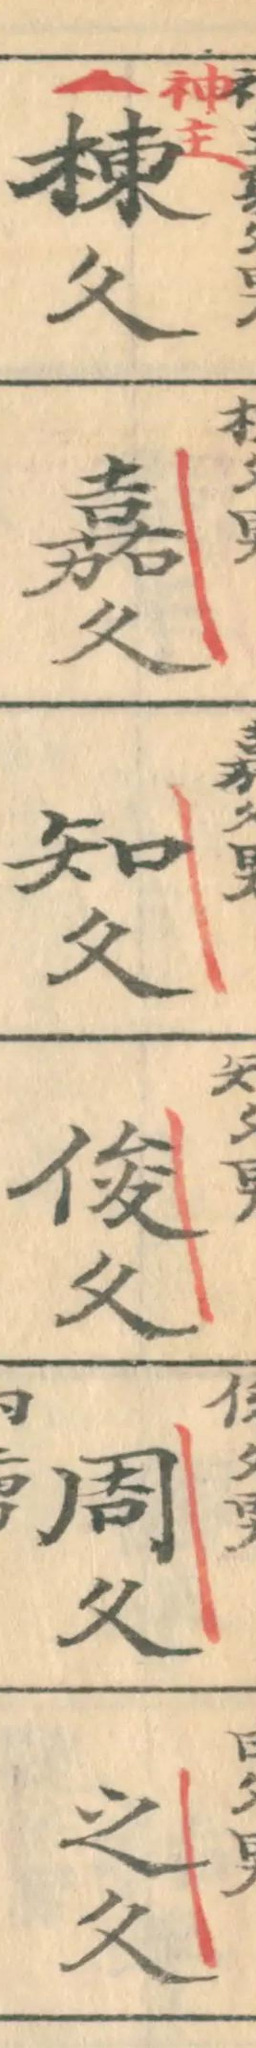▲棟久嘉久知久俊久周久之久
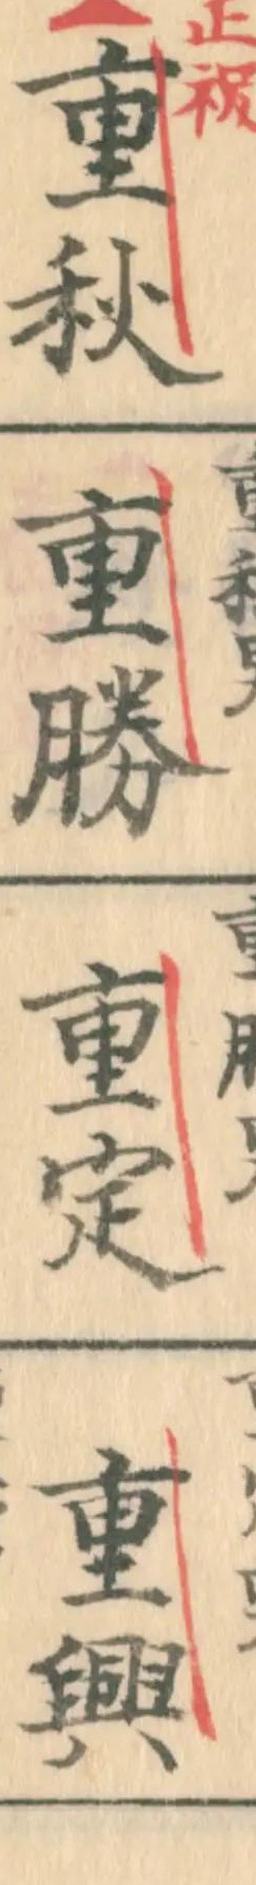▲重秋重勝重定重興
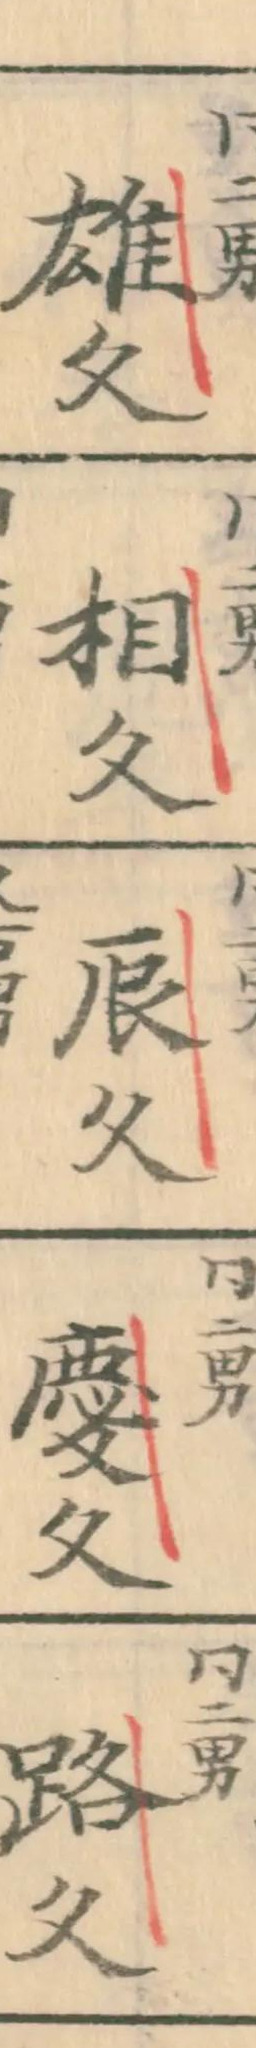雄久相久辰久慶久路久
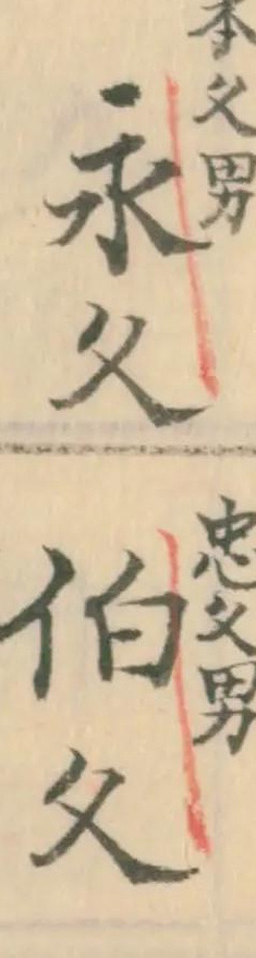永久伯久
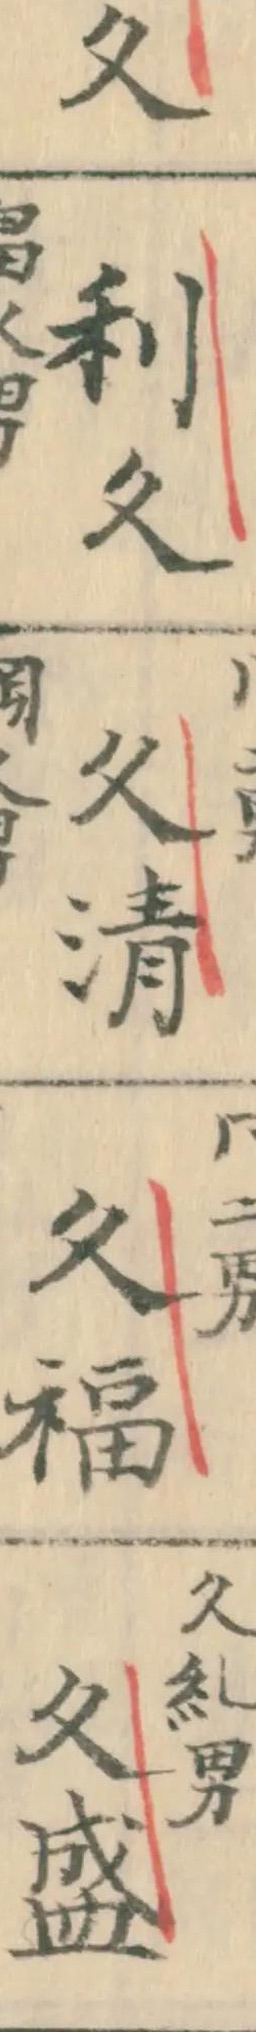畠久利久久清久福久盛
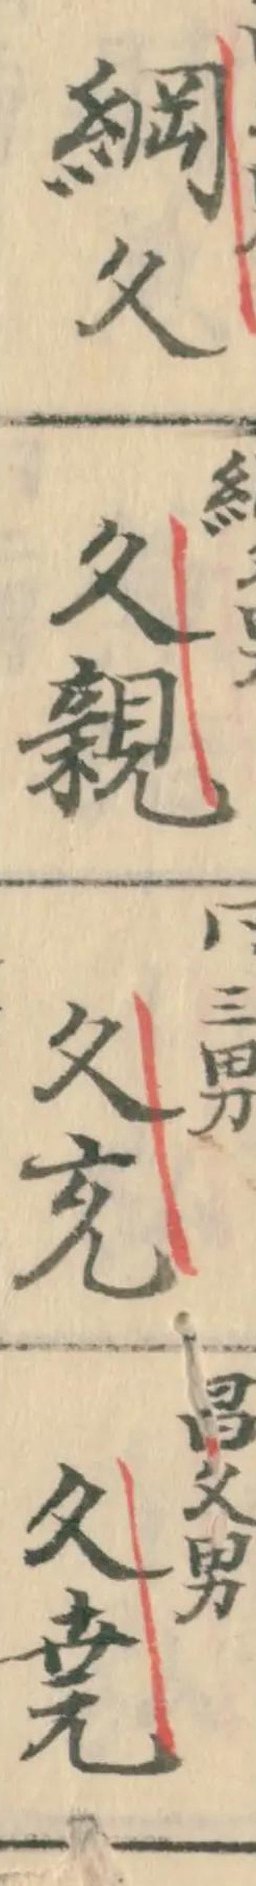綱久久親久充久尭
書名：賀茂社記録. 第24冊
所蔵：国立国会図書館 National Diet Library, JAPAN
